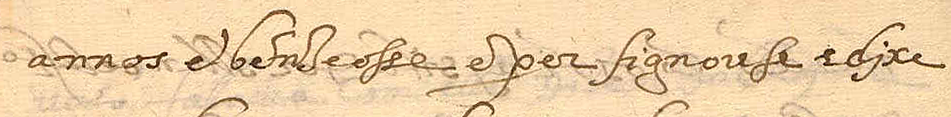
annos e benzeosse e persignouse E dixe
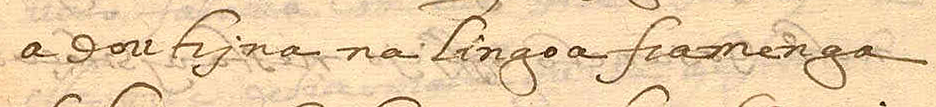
a doutrjna na lingoa framenga
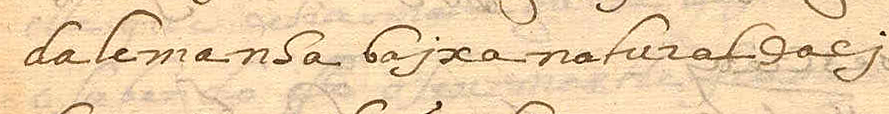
dalemanha bajxa natural da cj
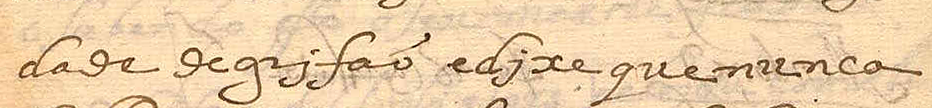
dade de grifaõ e djxe que nunca
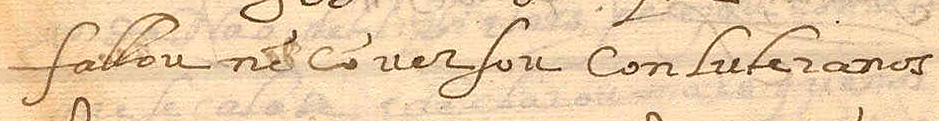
fallou nē cōuersou con Luteranos
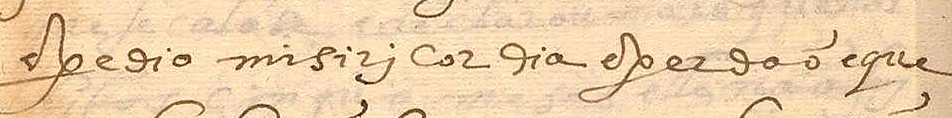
e pedio misirjcordia e perdaõ e que
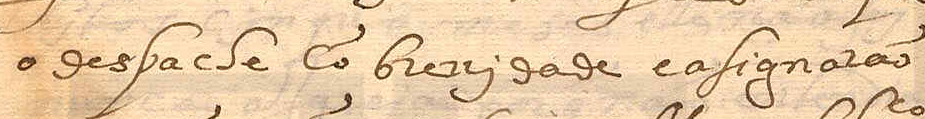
o despache cō breujdade e asignarão
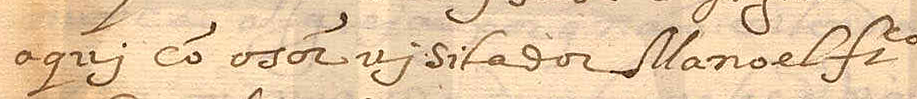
aquj cō o sor̄ ujsitador Manoel frco
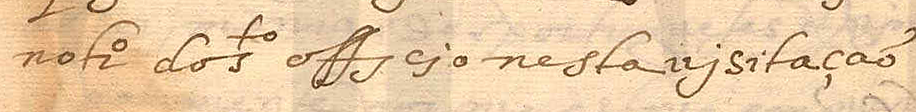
notro do sto offjcjo nesta ujsitaçaõ
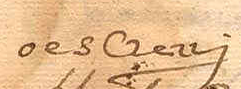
o escreuj
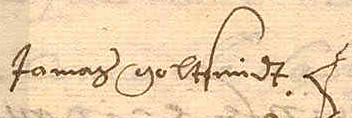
tomaz goltsmidt
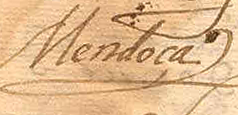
Mendoça
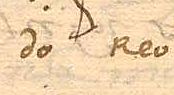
do Reo
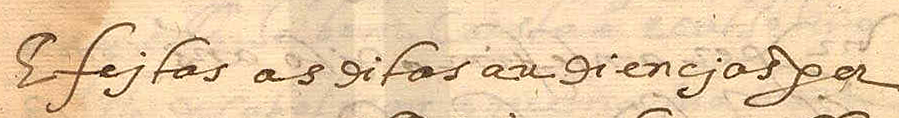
E fejtas as ditas audiencjas por
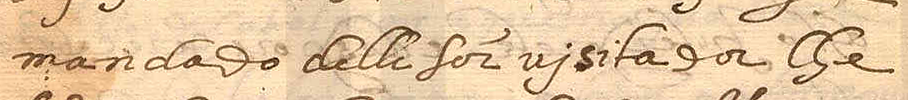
mandado delle sor̄ ujsitador lhe
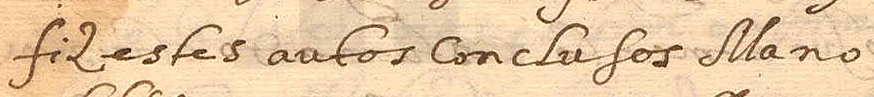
fiz estes autos conclusos Mano
